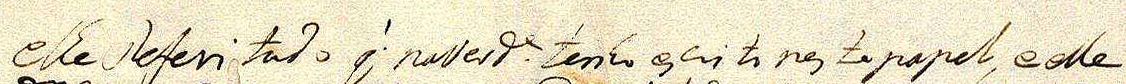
e lhe Referi tudo q̄ na verd.e tenho escrito neste papel, e elle
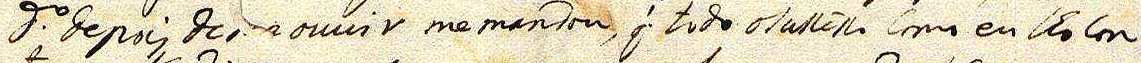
d.o depois de _ ouuir me mandou, q̄ todo o sussesso como eu lho con
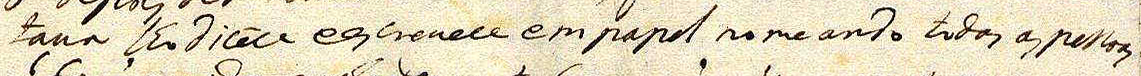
taua lho dicece e escreuece em papel nomeando todas as pessoas
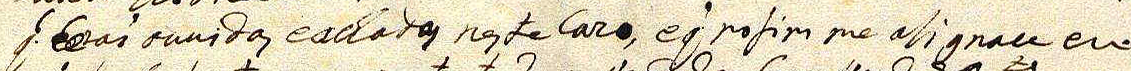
q̄ heraõ ouuidas e achadas neste Cazo, e q̄ no fim me asignace eu
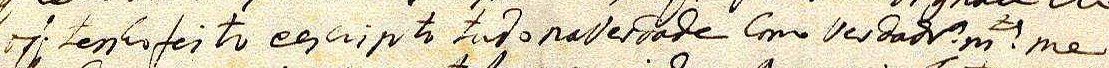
o q̄ tenho feito e escripto tudo na verdade Como verdadr.am.te me
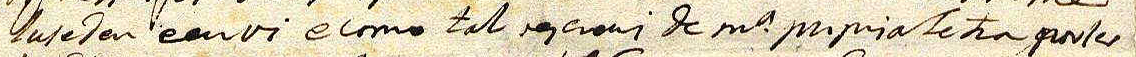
susedeu e ouvi e como tal o escreui de m.a propria letra, por ser
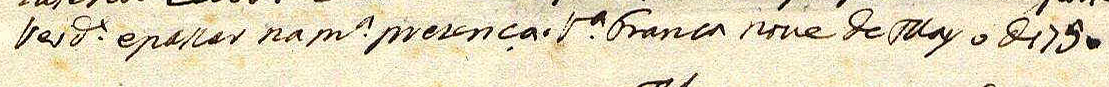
verd.e e passar na m.a prezença. V.a Franca noue de Mayo d̄ 1750
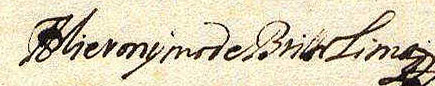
Hieronymo de Britto Lima
